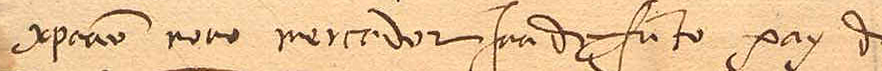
xpaão nouo mercador Jaa defūto pay de
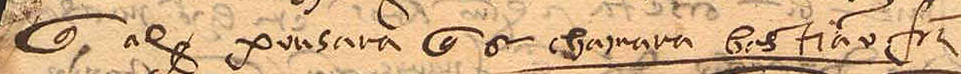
q̄ ahy pousaua q̄ se chamaua bastião fr̄z
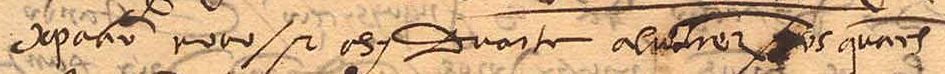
xpaão nouo / e asy Duarte aluārez / os q̄uaes
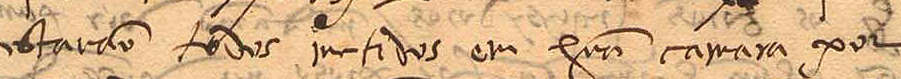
estauão todos metidos em hūa camara por
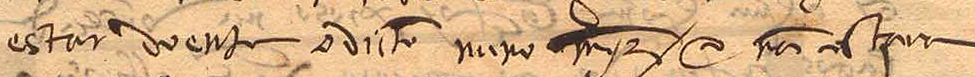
estar doente o dict̄o nuno m̄yz / e nā estaua
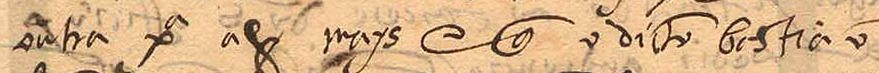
outra pa ahy mays e q̄ o dic̄to bastiaõ
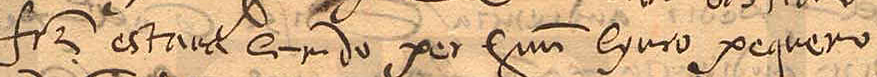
fr̄z estaua lemdo per hūu lyuro pequeno
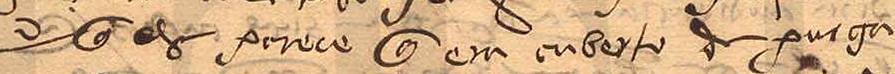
e q̄ lhe parece q̄ era cuberto de purga
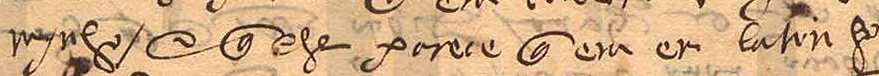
mynho / e q̄ lhe parece q̄ era em latin ho
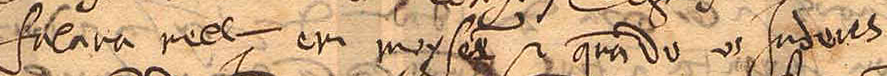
falaua nelle em moysēs e quādo os Judeus
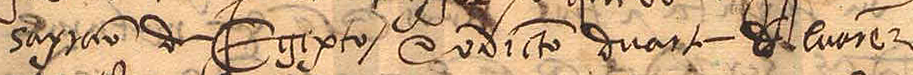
sayrão de Egipto/ e o dīcto duarte Aluar̄ez
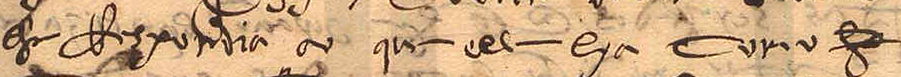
lhe Respondia ao que elle lya Como he
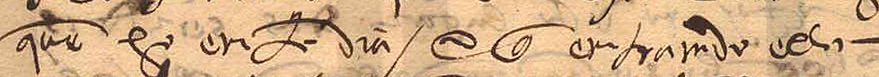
q̄ue ho emtēdia / e q̄ emtramdo elle
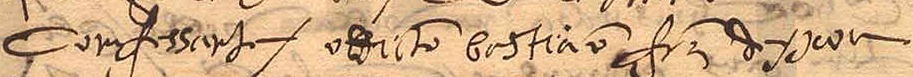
Comfessante / o dic̄to bastiaõ fr̄z deyxou
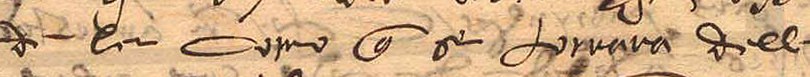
de ler como q̄ se tornaua delle
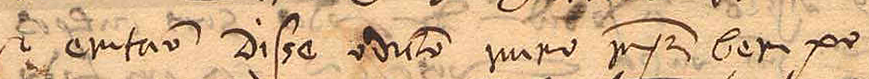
e emtaõ disse o dic̄to nuno m̄iz bem po
